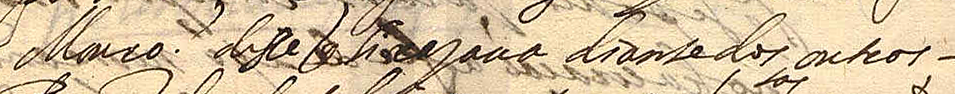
Mouro? disse q̄ si rezaua diante dos outros
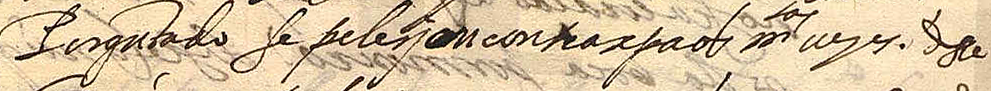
Pergūtado se peleijou contra xpaõs mtas uezes. disse
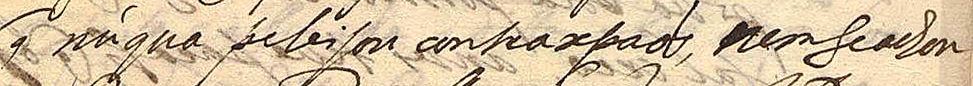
q̄ nūqua peleijou contra xpaõs, nem se achou
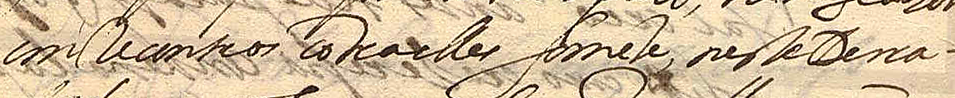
em Recontros cōtra elles somēte, neste Derra
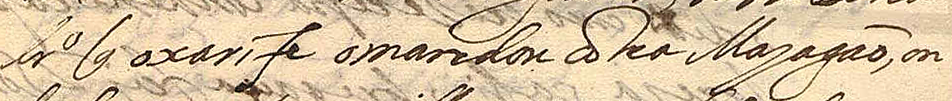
dro q̄ o xarife o mandou cōtra Mazagaõ, on
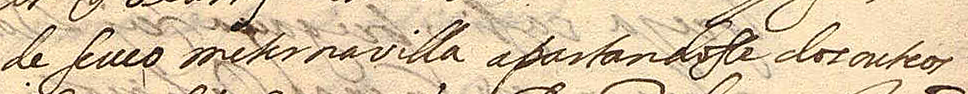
de se ueo meter na villa apartandosse dos outros
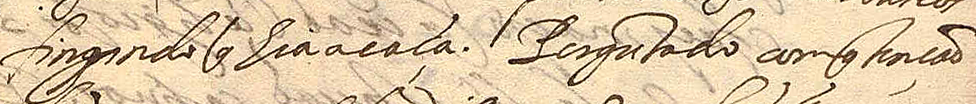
fingindo q̄ hia a caça. Pergūtado com q̄ tençaõ
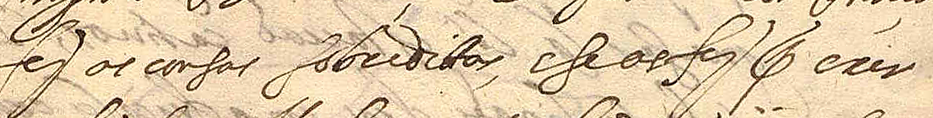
fez as cousas sobredittas, E se as fez p̄ crer
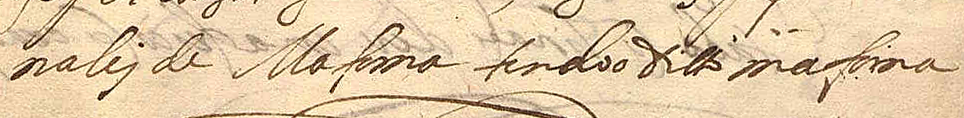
na lej de Mafoma tendo o ditto mafoma
